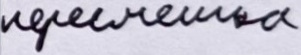пересмешка
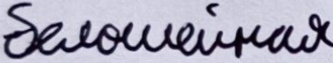белошейная
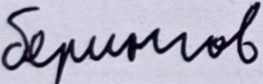берингов
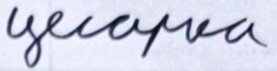цесарка
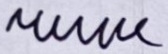чиж
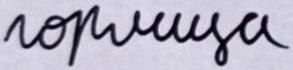горлица
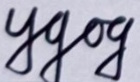удод
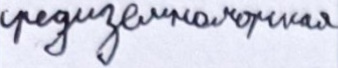средиземноморская
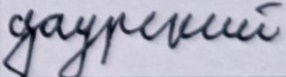даурский
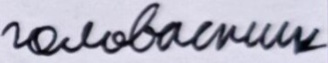головастик
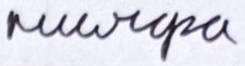нимфа
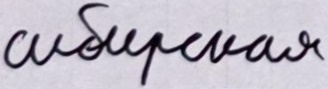сибирская
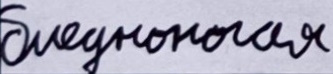бледноногая
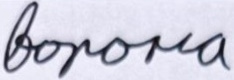ворона
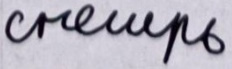снегирь
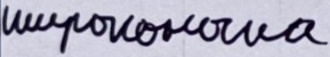широконоска
